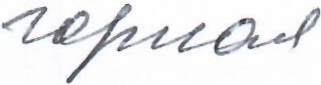горная
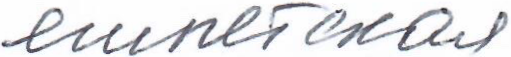египетская
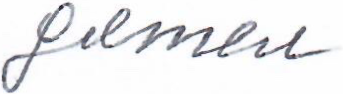дятел
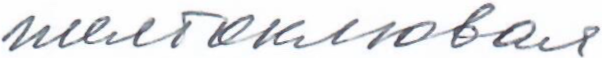желтоклювая
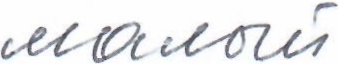малый
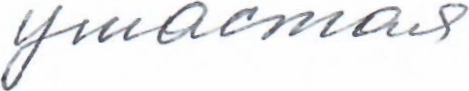ушастая
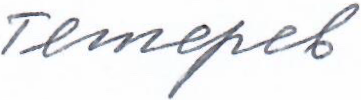тетерев
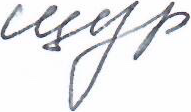щур
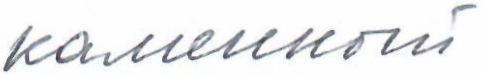каменный
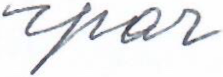грач
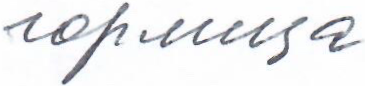горлица
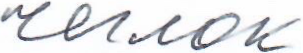чеглок
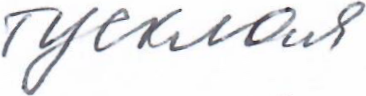тусклая
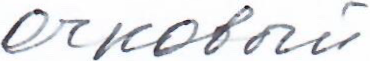очковый
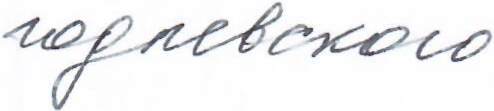годлевского
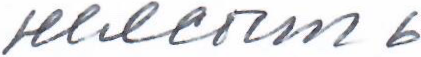неясыть
